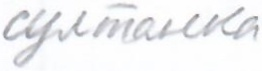султанка
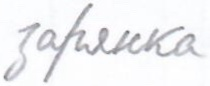зарянка
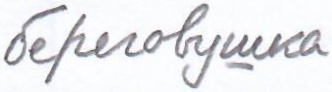береговушка
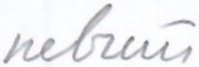певчий
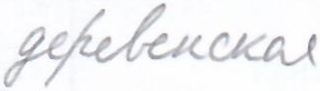деревенская
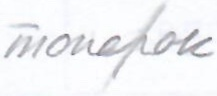топорок
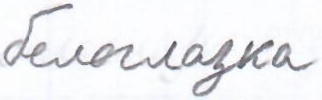белоглазка
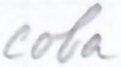сова
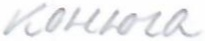конюга
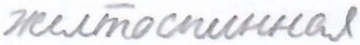желтоспинная
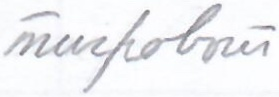тигровый
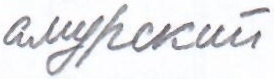амурский
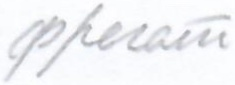фрегат
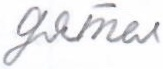дятел
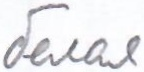белая
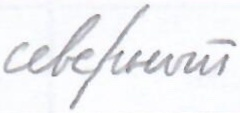северный
